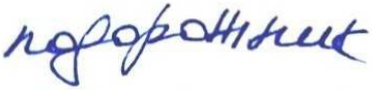подорожник
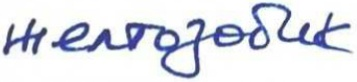желтозобик
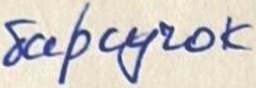барсучок
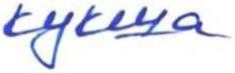кукша
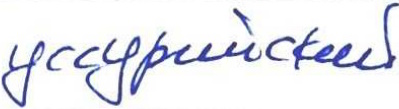уссурийский
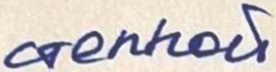степной
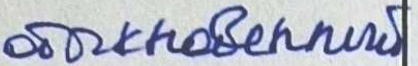обыкновенный
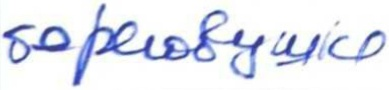балобан
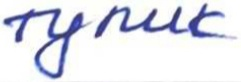тупик
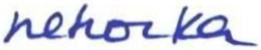пеночка
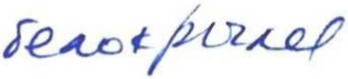белокрылая
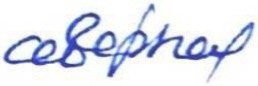северная
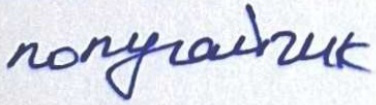попугайчик
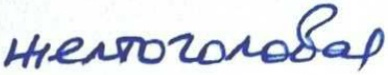желтоголовая
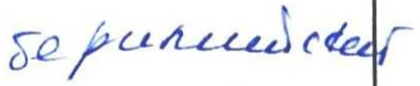берингийский
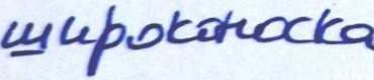широконоска
